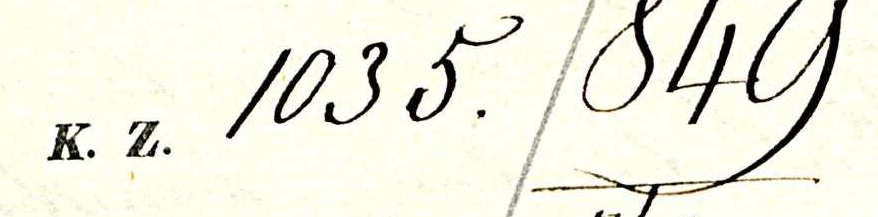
KZ 1035 849
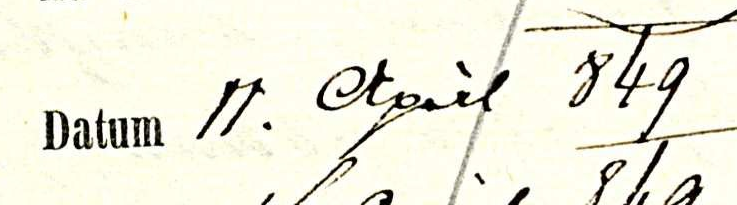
Datum 11. April 849
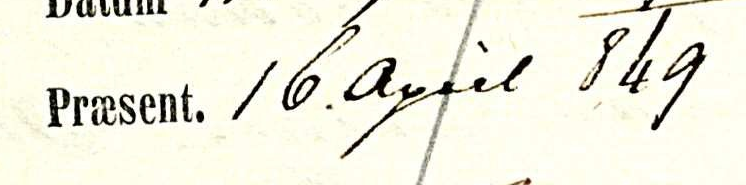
Praesent. 16. April 849
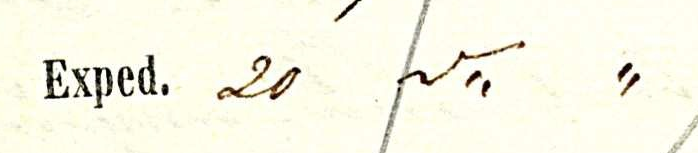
Exped. 20 “ “
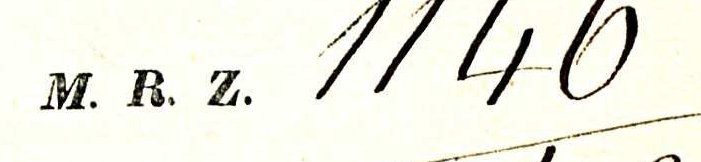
MRZ 1146
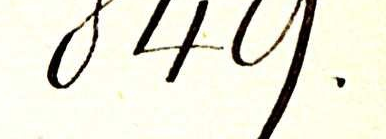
849
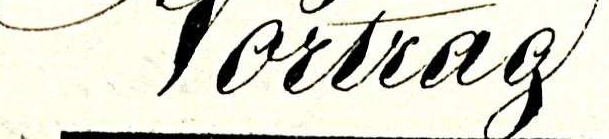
Vortrag
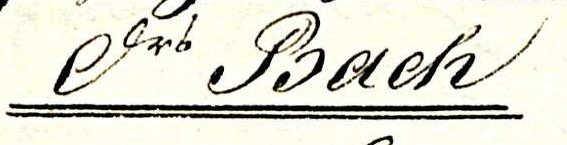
der Bach
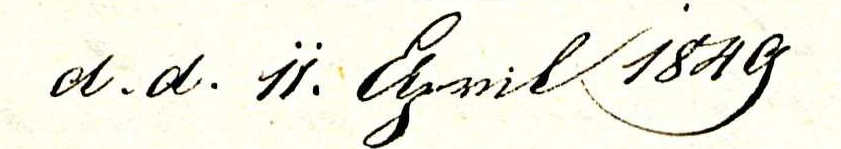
dd 11. April 1849
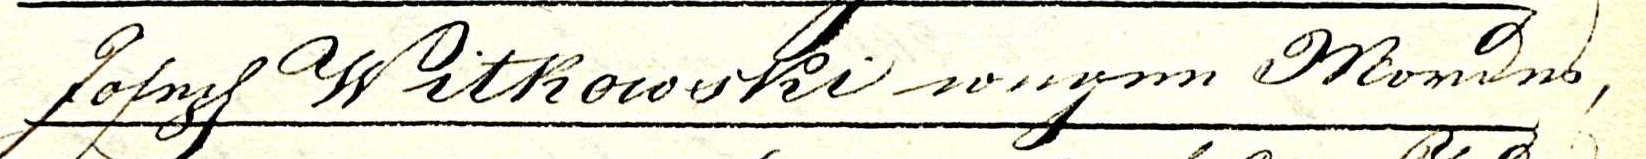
Joseph Witkowski wegen Mordes
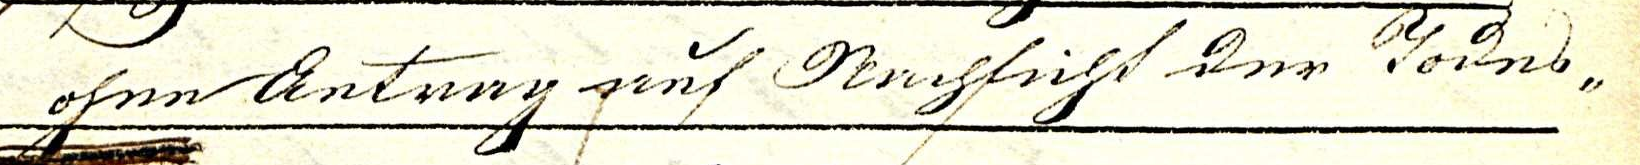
ohne Antrag auf Nachsicht der Todes¬
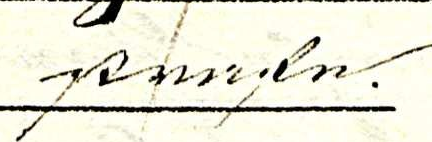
strafe
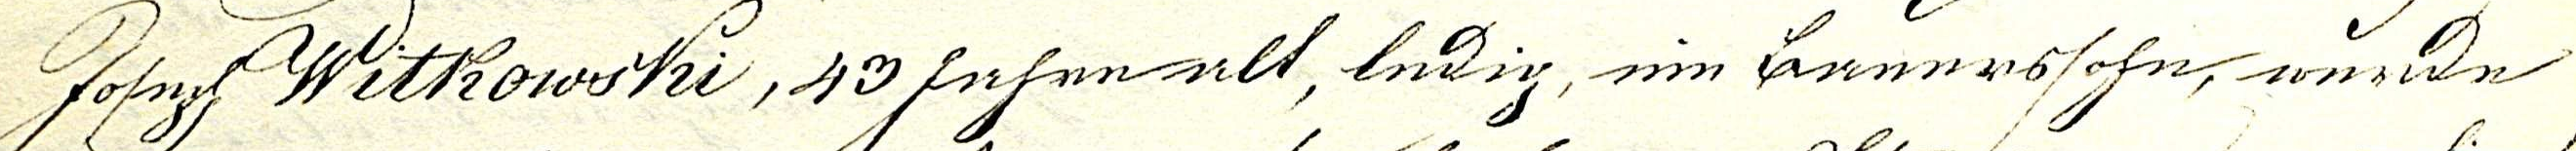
Joseph Witkowski, 43 Jahre alt, ledig, ein Bauerssohn, wurde
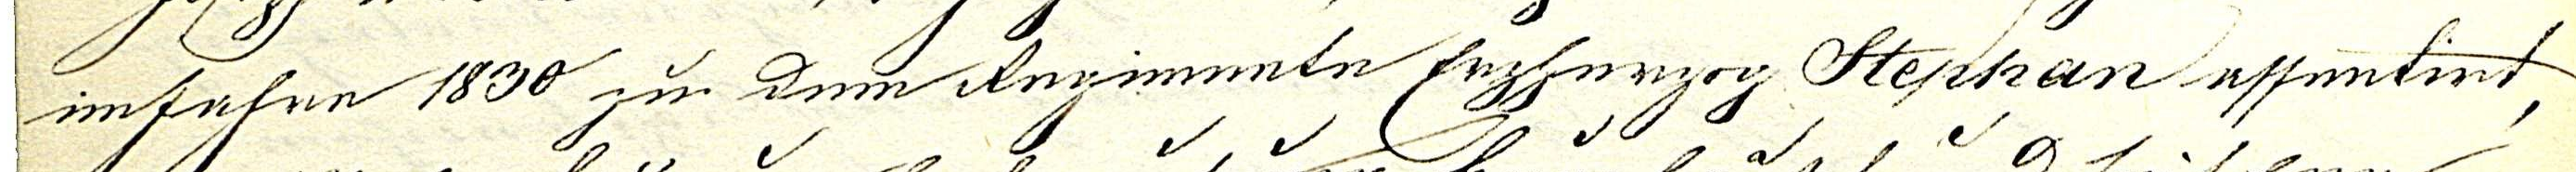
im Jahre 1830 zu dem Regimente Erzherzog Stephan assentirt,
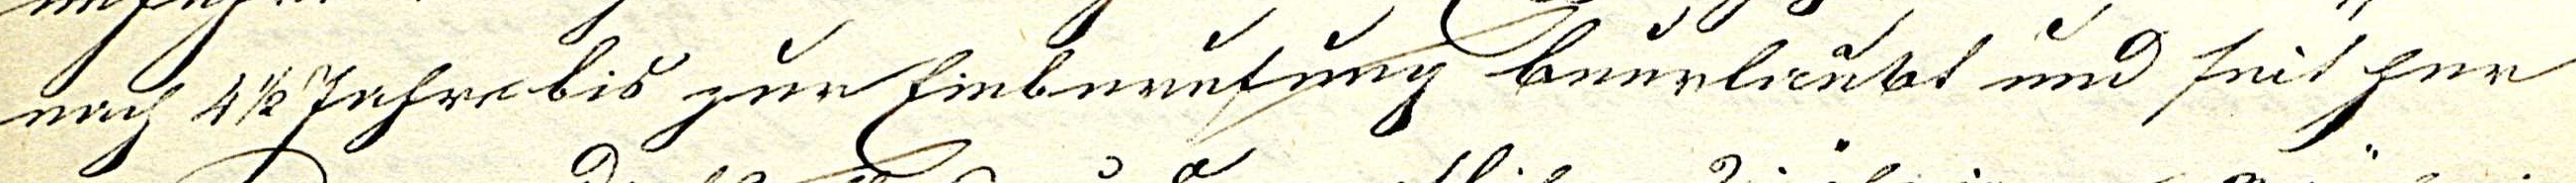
[(österreichisch veraltet) auf Militärdiensttauglichkeit hin untersuchen] nach 4 ½ Jahre bis zur Einberufung beurlaubt und seither
